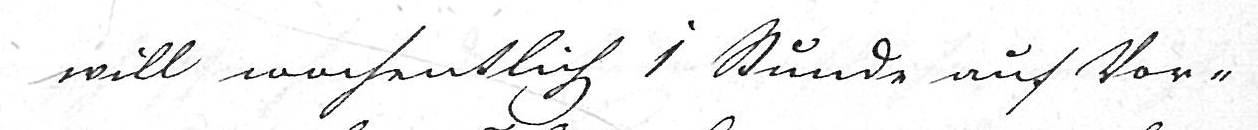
will wochentlich 1 Stunde auf Vor-
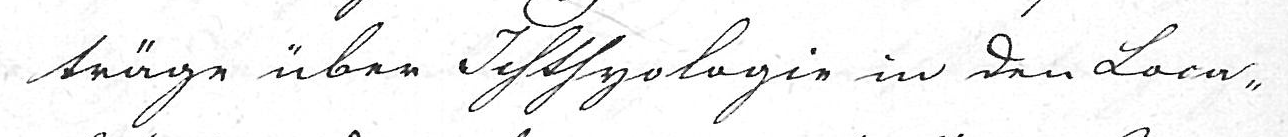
träge über Ichthyologie in den Loca-
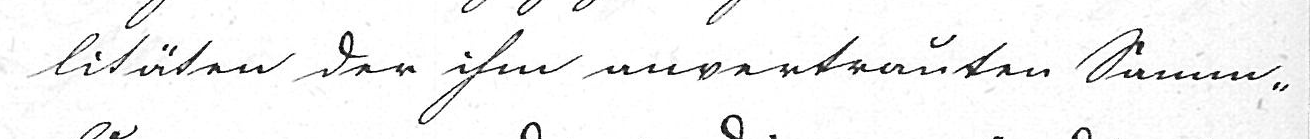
litäten der ihm anvertrauten Samm-
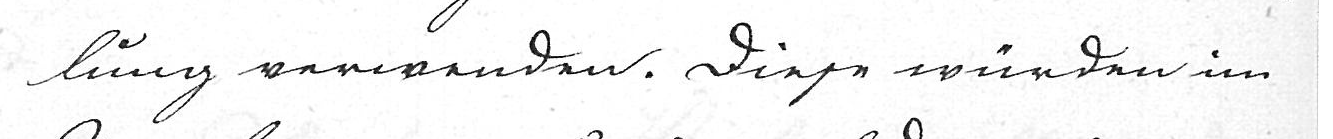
lung verwenden. Diese würden im
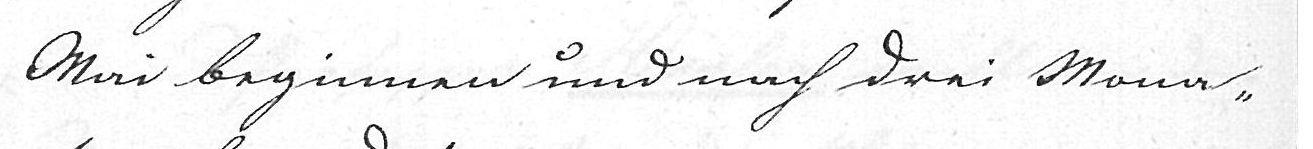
Mai beginnen und nach drei Mona-
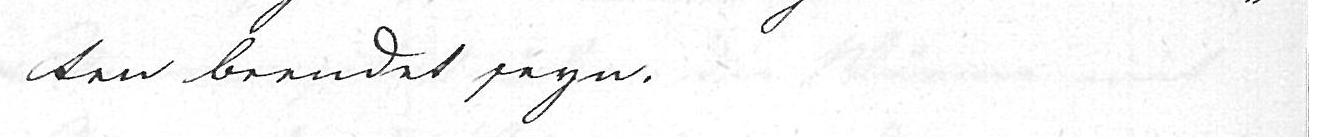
ten beendigt seyn.
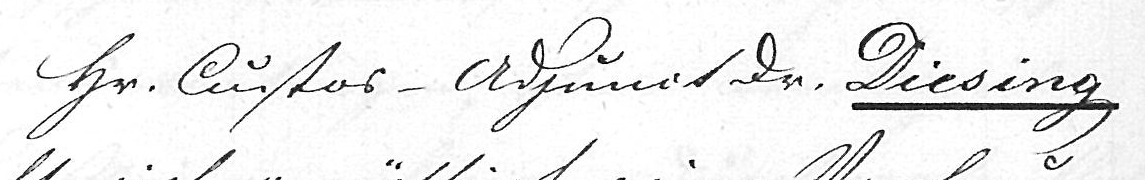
Hr. Custos-Adjunct Dr. Diesing
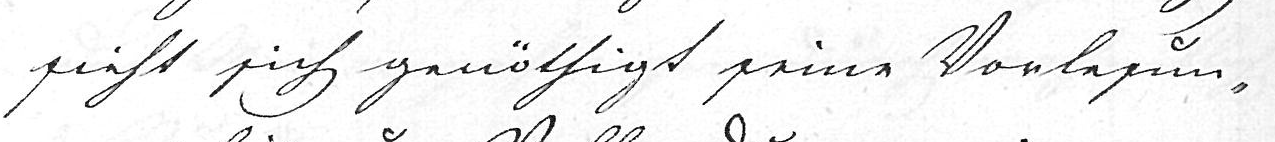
sieht sich genöthigt seine Vorlesun-
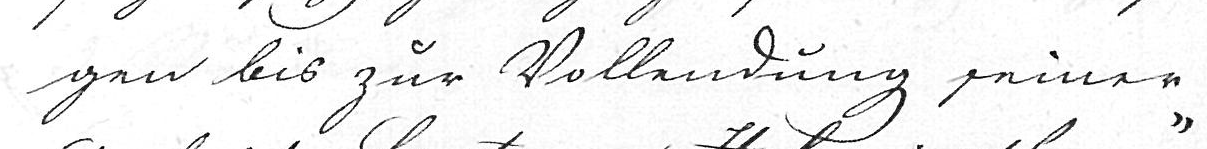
gen bis zur Vollendung seiner
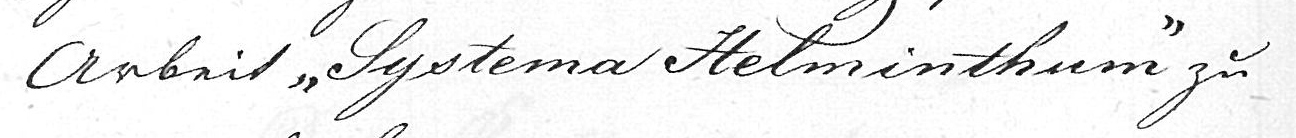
Arbeit "Systema Helminthum" zu
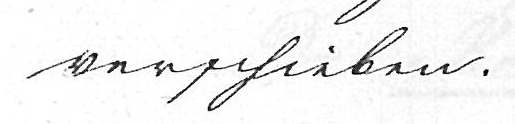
verschieben.
